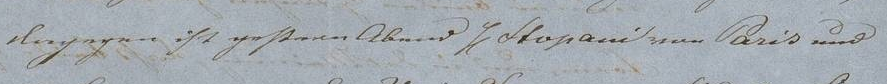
dagegen ist gestern Abend H Stopani von Paris und
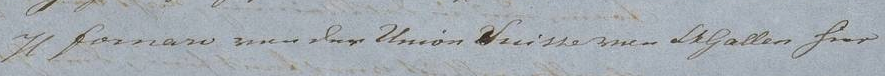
H Fornaro von der Union Suisse von St Gallen hier
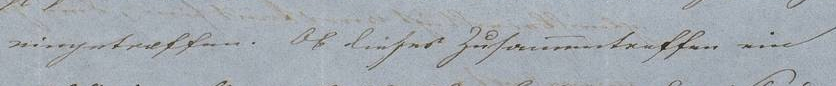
eingetroffen. Ob dieses Zusammentreffen ein
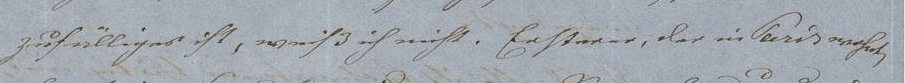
zufälliges ist, weiß ich nicht. Ersterer, der in Paris wohnt,
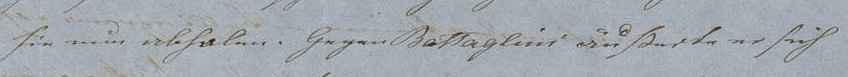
sie nun abholen. Gegen Battaglini äußerte er sich
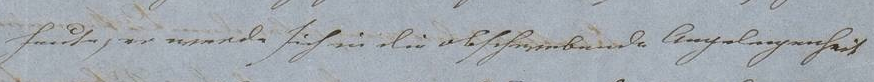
heute, er werde sich in die obschwebende Angelegenheit
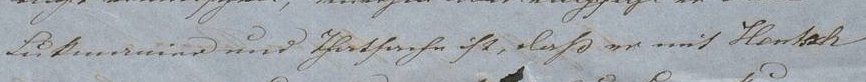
Lukmanier und Thatsache ist, daß er mit Hentsch
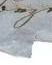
Aus
